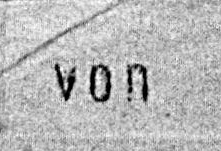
von
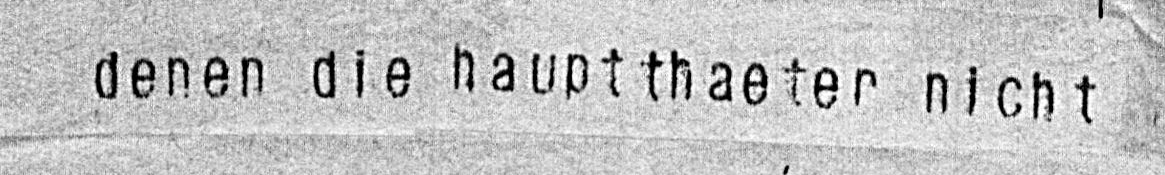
denen die hauptthaeter nicht
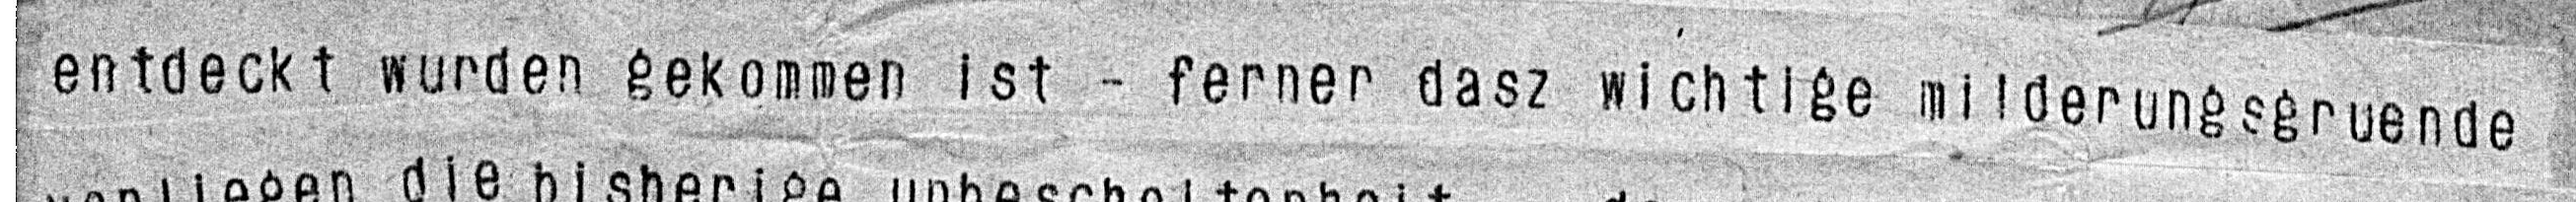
entdeckt wurden gekommen ist - ferner dasz wichtige milderungsgruende
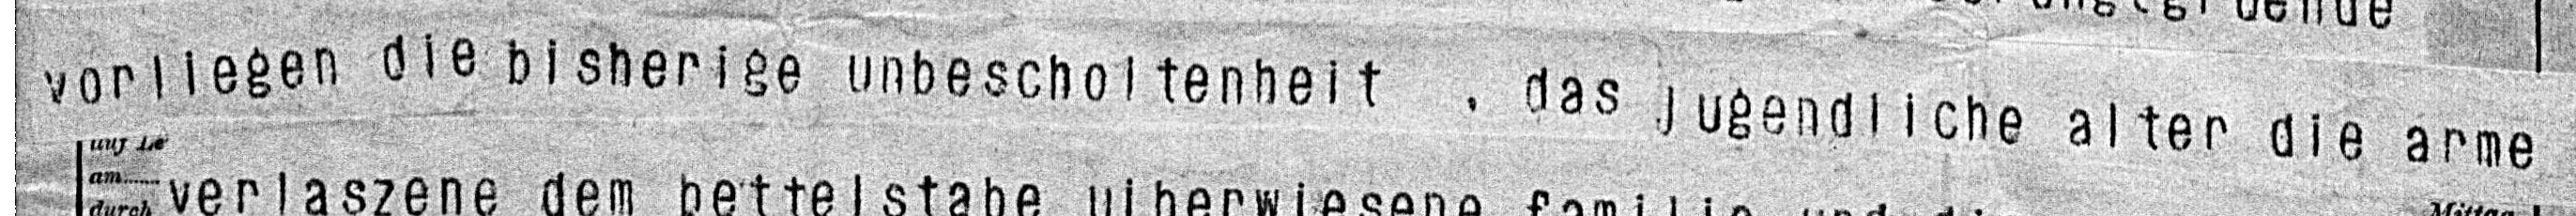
vorliegen diebisherige unbescholtenheit, das jugendliche alter die arme
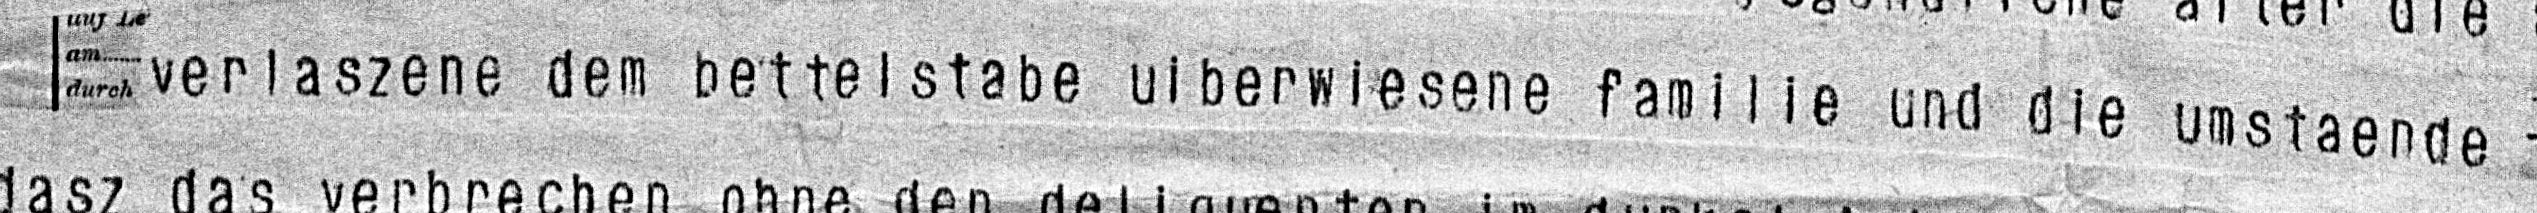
verlaszene dem bettelstabe uiberwiesene familie und die umstaende
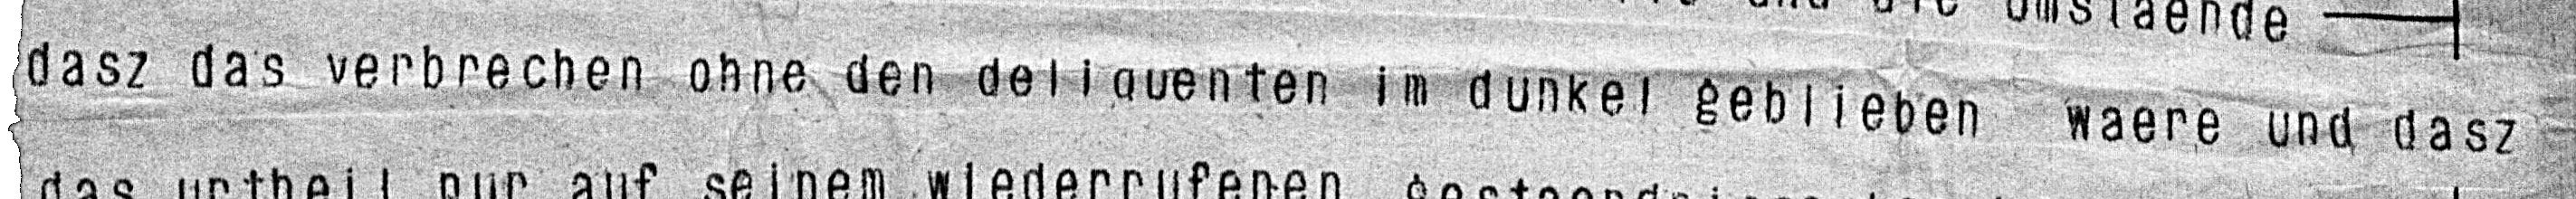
dasz das verbrechen ohne den deliquenten im dunkel geblieben waere und dasz
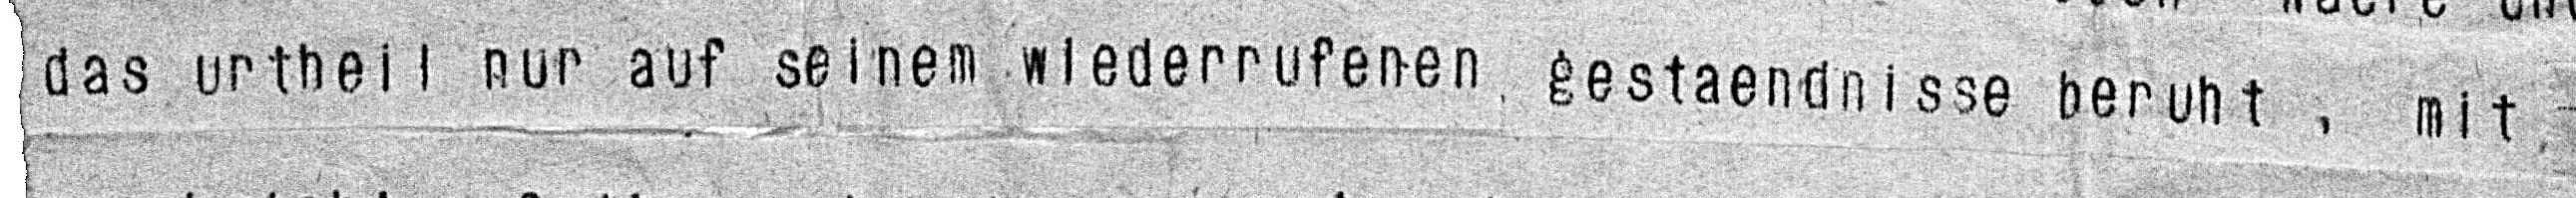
das urtheil nur auf seinem wiederrufenen gestaendnisse beruht, mit
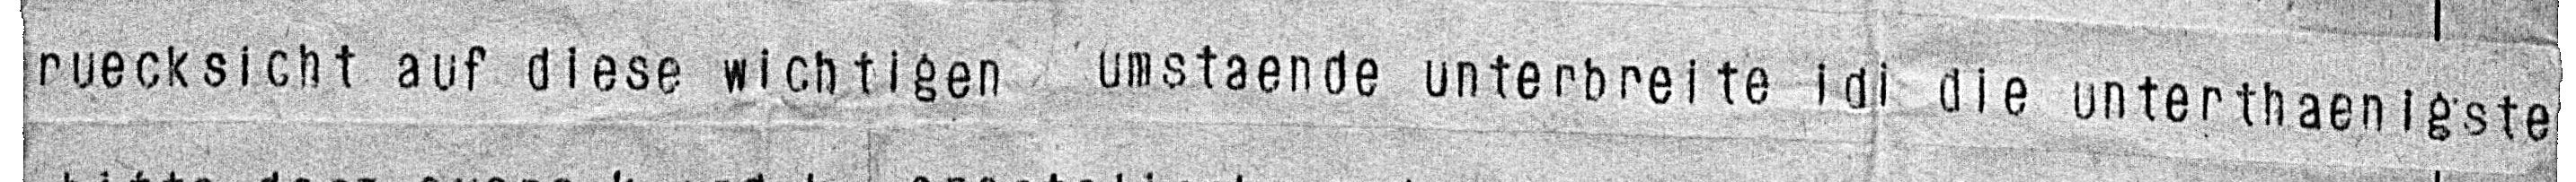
ruecksicht auf diese wichtigen umstaende unterbreite ich die unterthaenigste
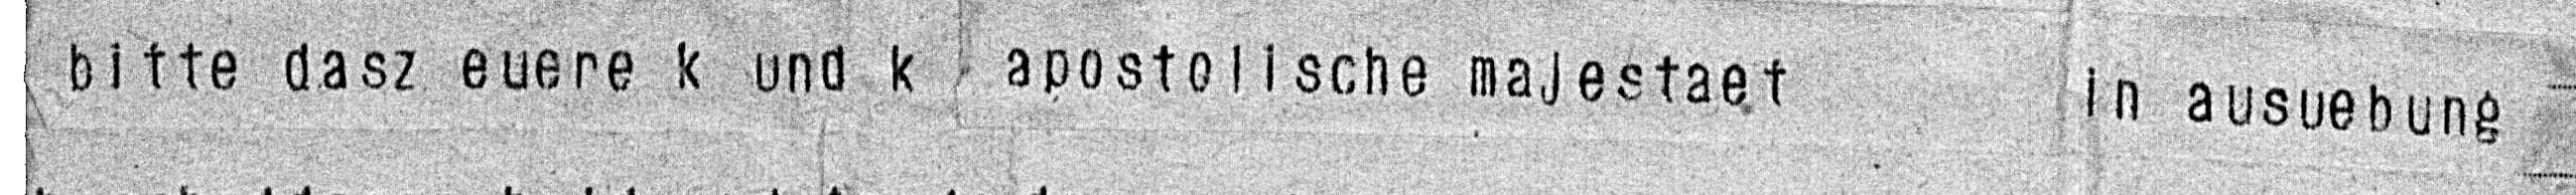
bitte dasz euere k und k apostolische majestaet in ausuebung
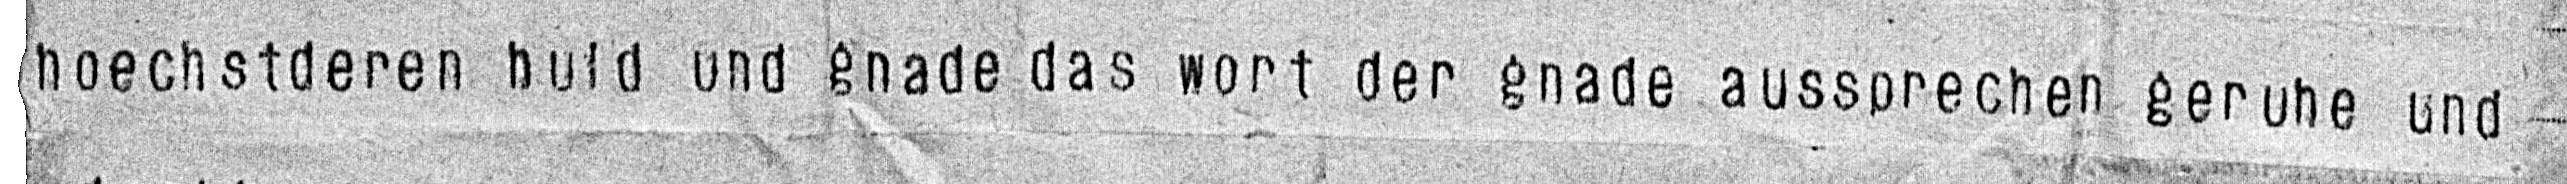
hoechstderenhuld und gnade das wort der gnade aussprechen geruhe und
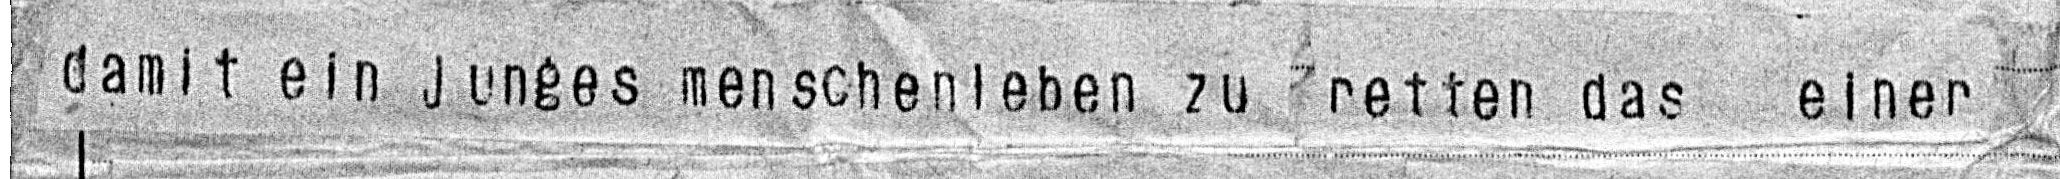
damitein Junges menschenleben zu retten das einer
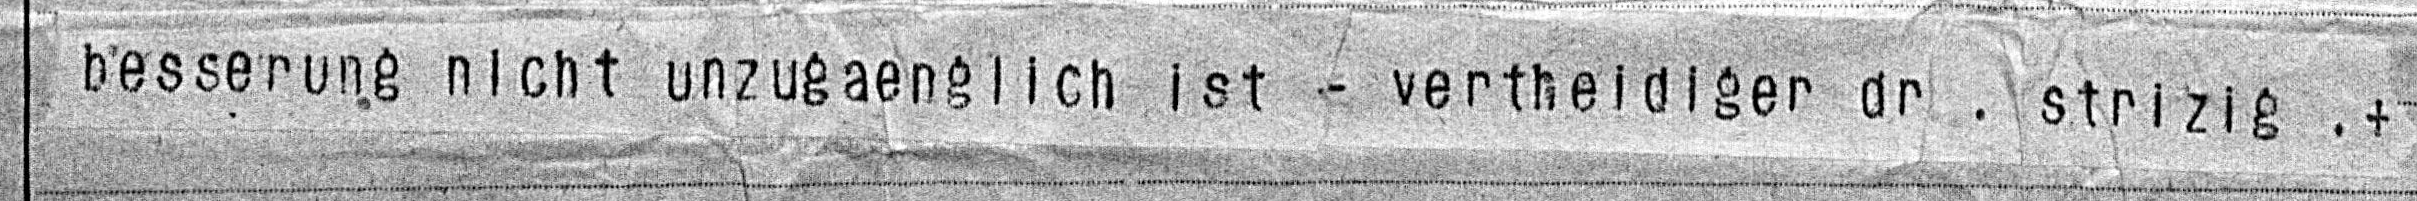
besserung nicht unzugaenglich ist - vertheidiger dr. strizig.+
